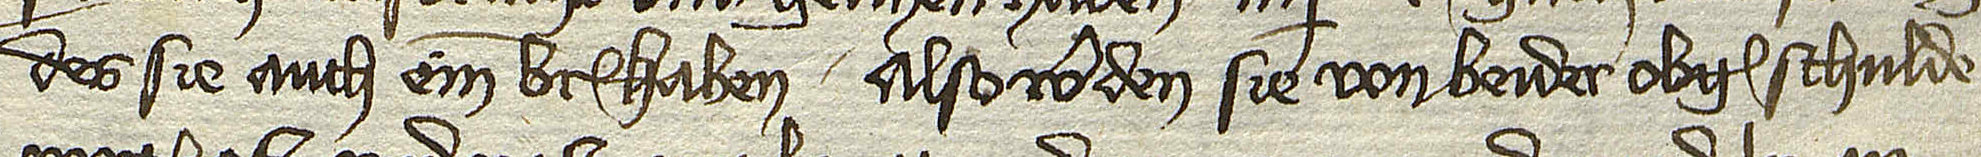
des ſie auch ein* b* haben / Alſo w*den ſie von beider obg* ſchulde
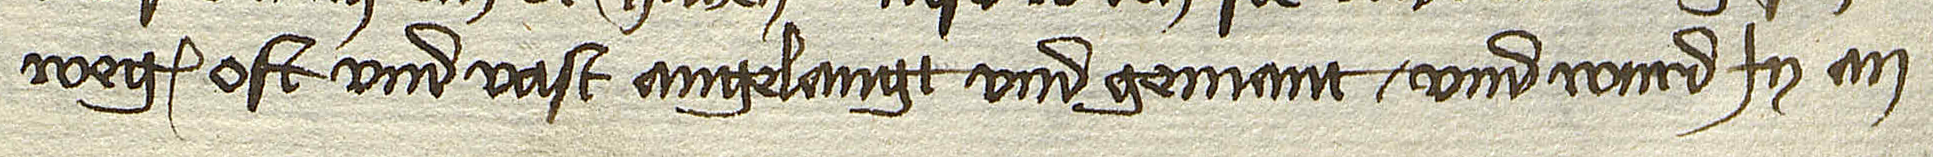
weg* oft vnd vaſt angelangt vnd gemant / vnd wurd In an
